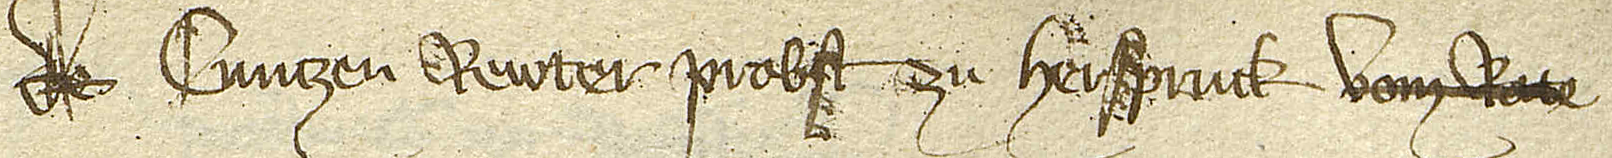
De Cuncʒen Rewter probſt cʒu herſpruck vom Rate
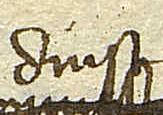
dinſt
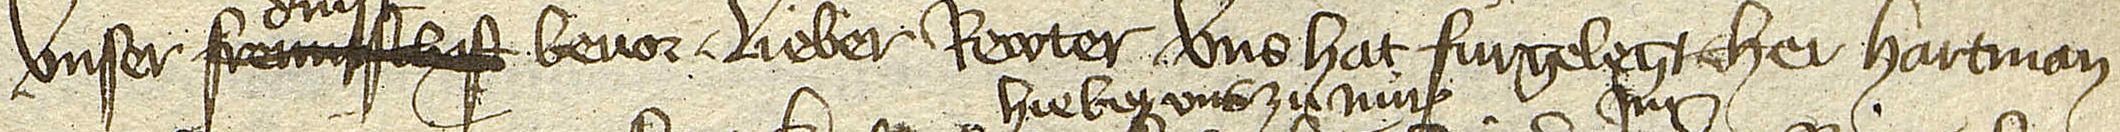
Vnſer freuntſchaft beuor / Lieber Rewter / vns hat fürgelegt her hartman
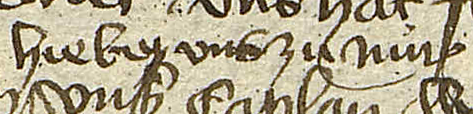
hiebey vns cʒu Nür*
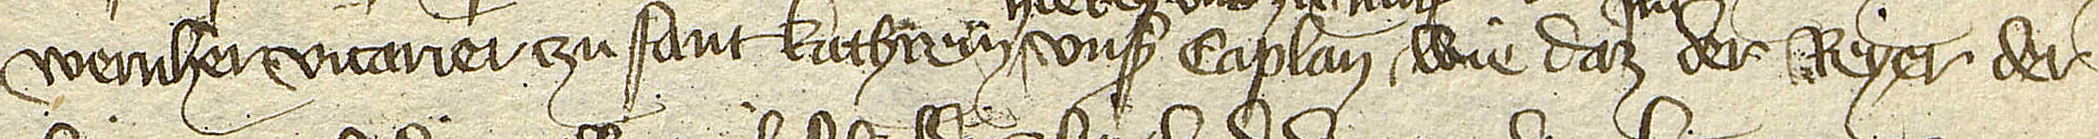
wernher vicarier cʒu ſant kathein vnſ* Caplan / wie daʒ der Reyer der
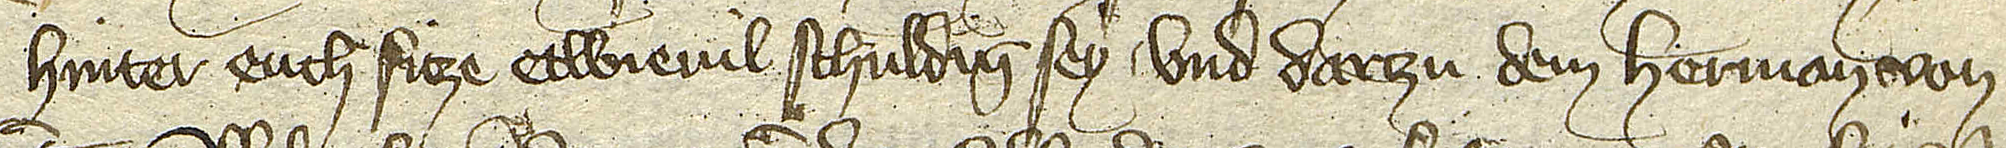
hinter euch ſicʒe etwieuil ſchuldig ſey / vnd darcʒu dem herman von
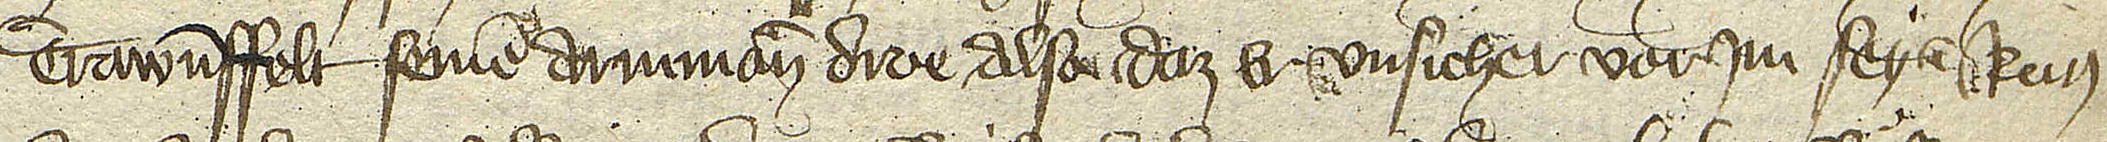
Trawn*ffelt ſeine* Armman* droe / Alſo / daʒ Er vnſicher vor Im ſey / Rein
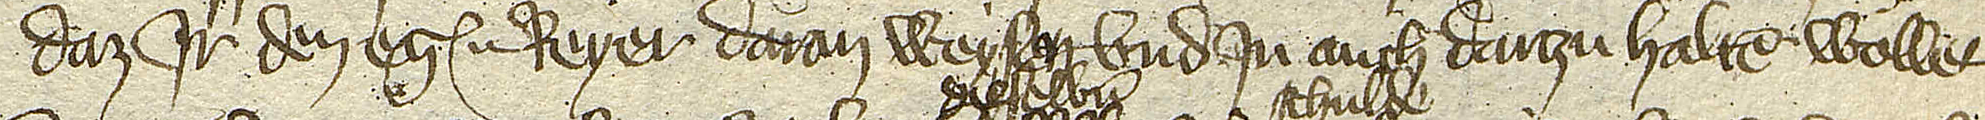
daʒ Ir den eg* ~ Reyer daran weyſen vnd In auch darcʒu halte* wöllet
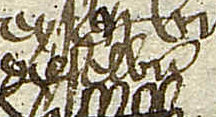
dieſelbn*
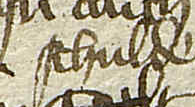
ſchulde
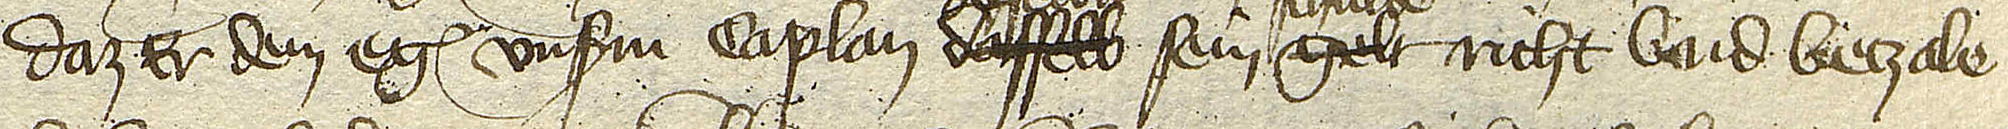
daʒ Er dem eg* vnſ*m Caplan daſſelb ſein gelt richt vnd becʒale
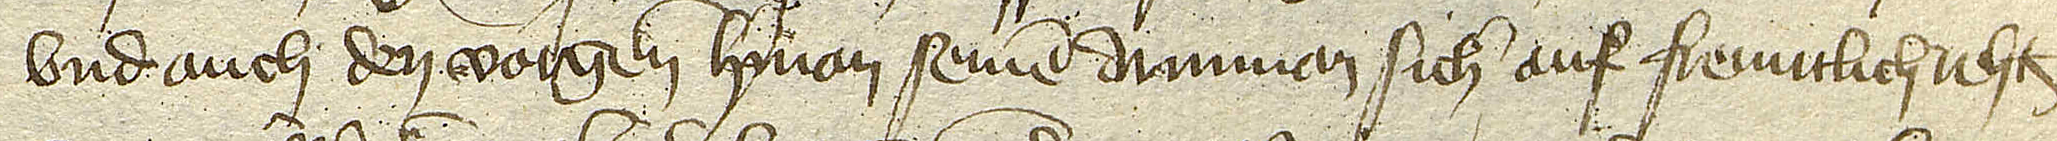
vnd auch den vorgen* h*man ſeine* Armman ſich* auf freuntlich rehts
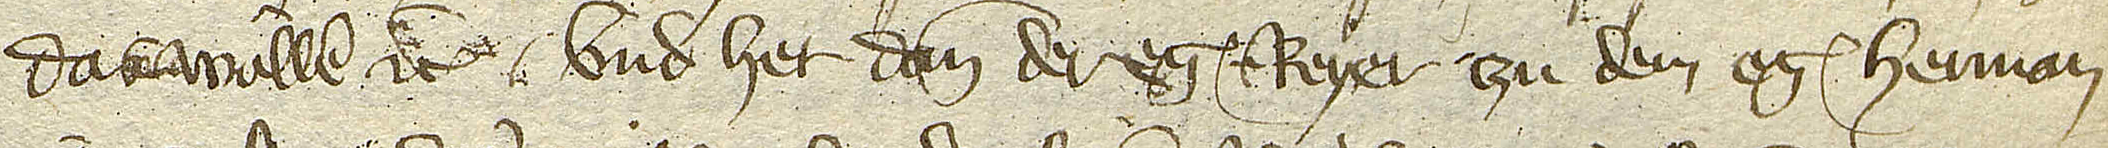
das wölle* ec* / vnd het dan* der eg* ~ Reyer cʒu dem eg* herman
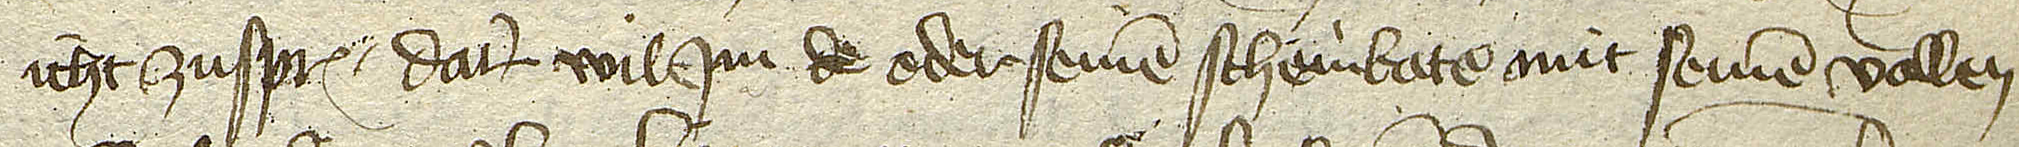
icht cʒuſpr* / dar* wil Im d* oder ſeine* ſcheinbote mit ſeine* vollen
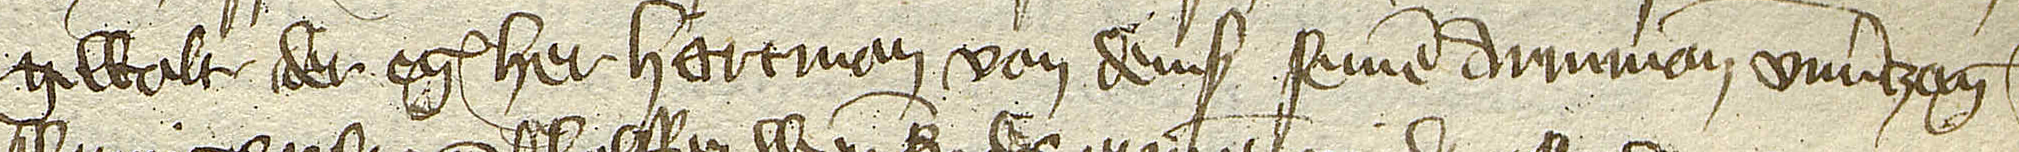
gewalt / der eg* her hartman von demſ* ſeine* Armman vnu*cʒog*
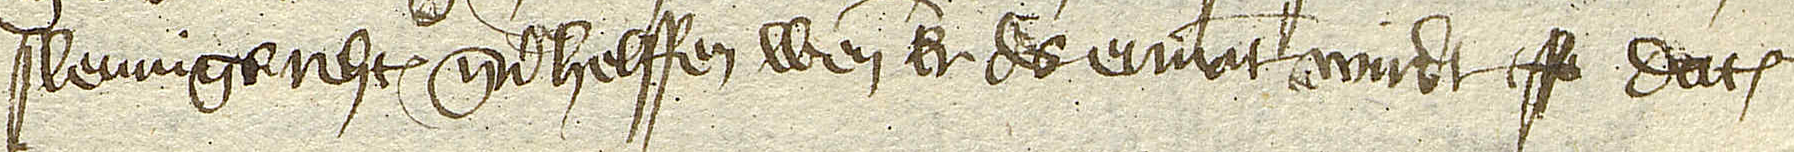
ſlewnigs reht* gn* helffen wen* Er des ermat* wirdt / ſ dat*
